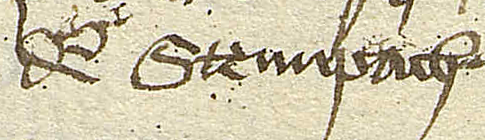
d* Steinpach
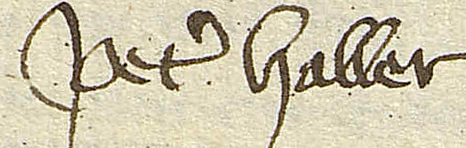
Pet* haller
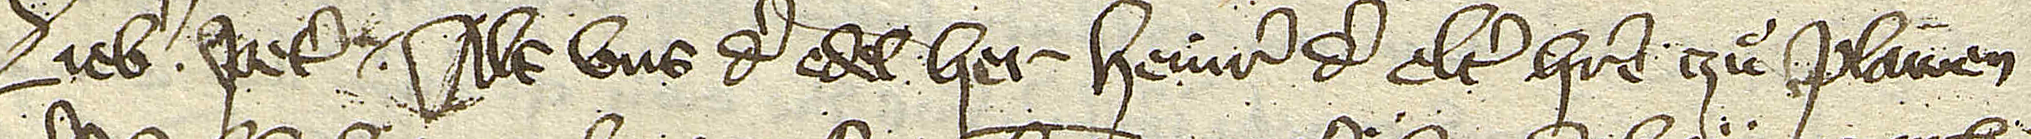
Lieb* . Pet / . Als vns d* edel her heinr* d* elt* hr*e cʒü Plawen
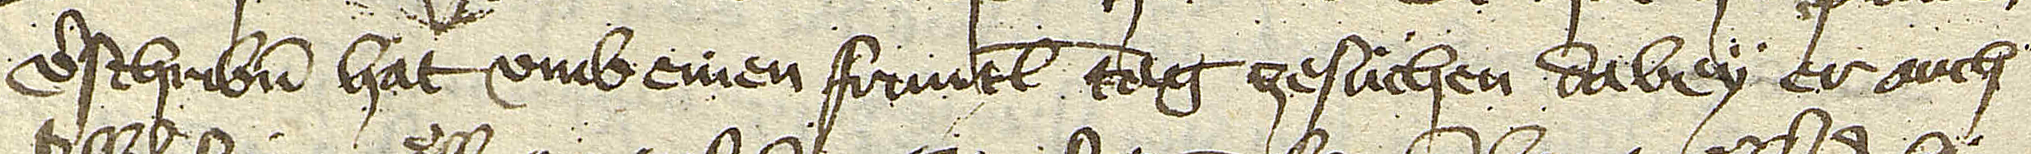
v*ſchribn* hat vmb einen fruntl* tag cʒeſuchen dabey er auch
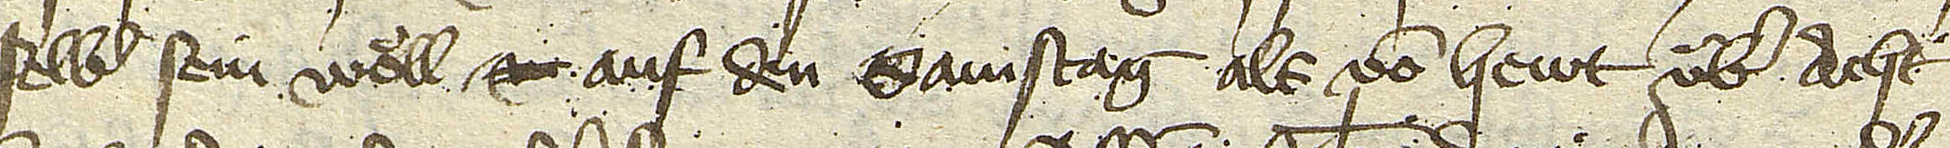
ſelb* ſein wöll / w auf den Samſtag als vo* hewt v̈b* Acht
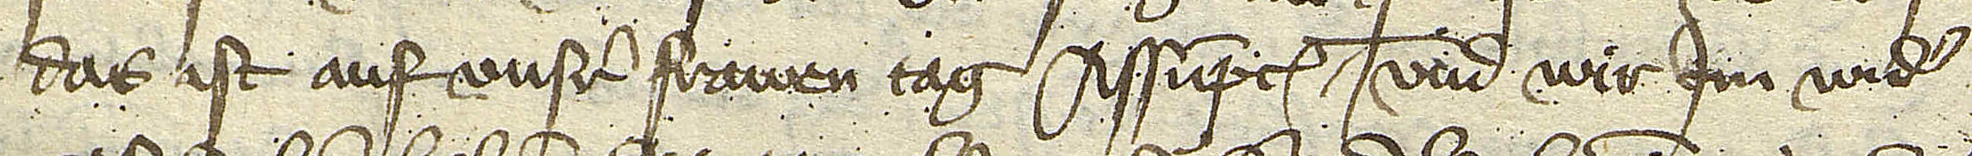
das iſt auf vnſr* frawen tag Aſſupc* / vnd wir Im wid*
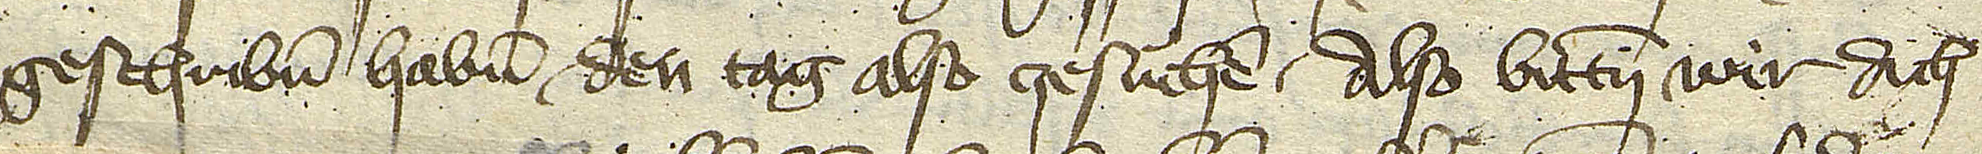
geſchribn* habn* / den tag alſo cʒeſüche* / Alſo bittn* wir dich
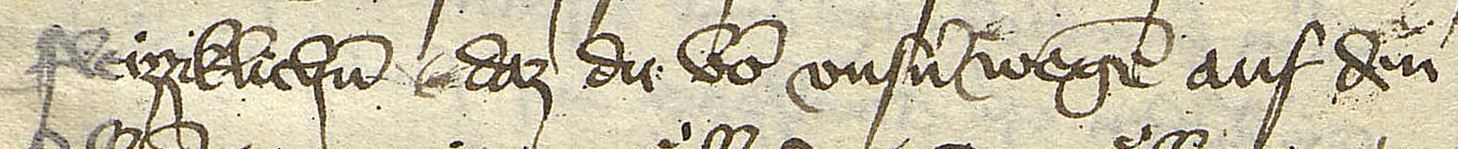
fleiʒʒklichn* / daʒ du vo* vnſn* wege* auf den
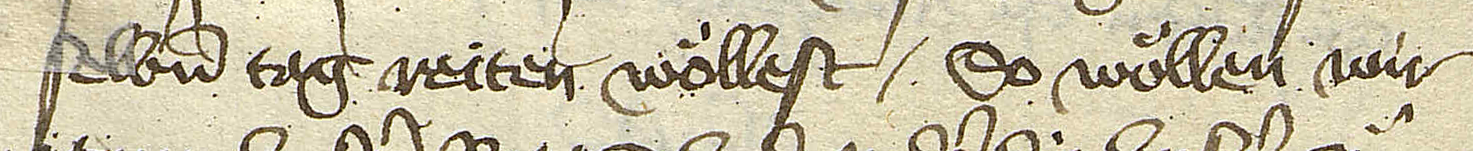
ſelbn* tag reiten wölleſt / So wöllen wir
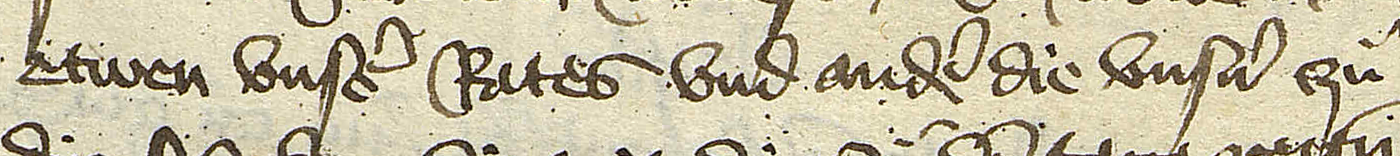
etwen vnſs* Rates vnd ande* die vnſn* cʒü
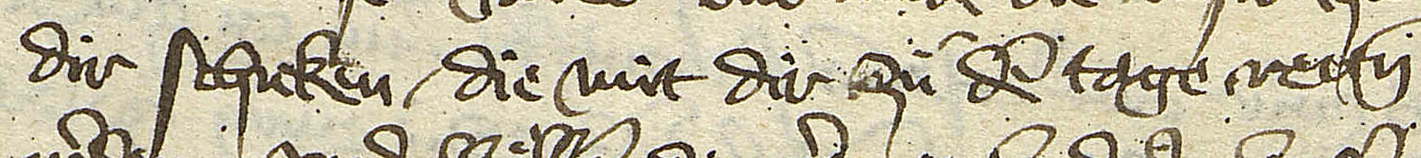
dir ſchicken / die mit dir cʒü d* tage reitn*
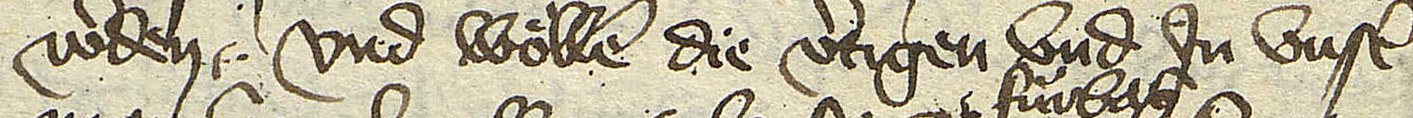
w*den / . vnd wölle* die v*tigen vnd In vnſe*
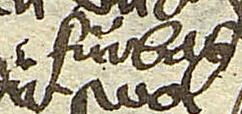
fürbas
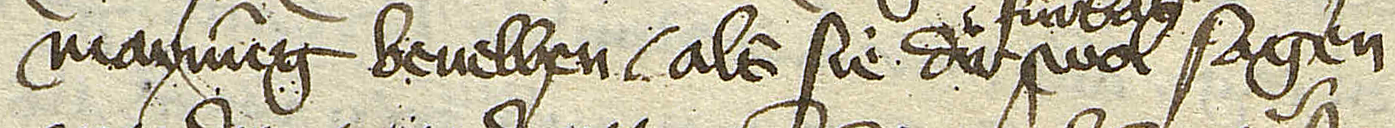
maynug* beuelhen / als ſie dir wol ſagen
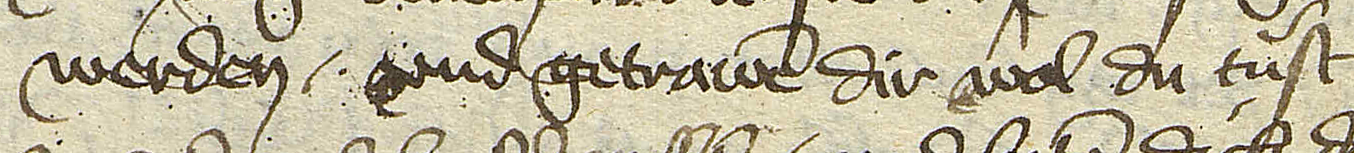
werden / . vnd getrawe* dir wol du tüſt
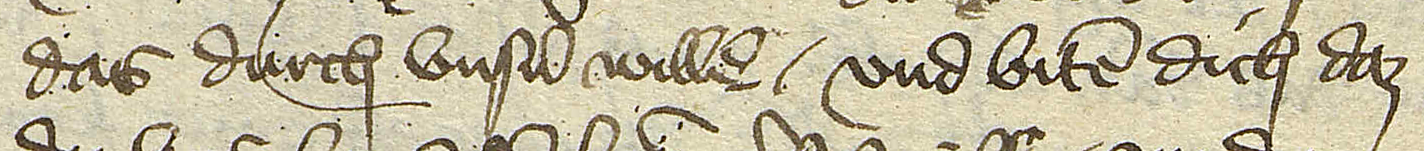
das durch vnſn* wille* / vnd bite* dich daʒ
